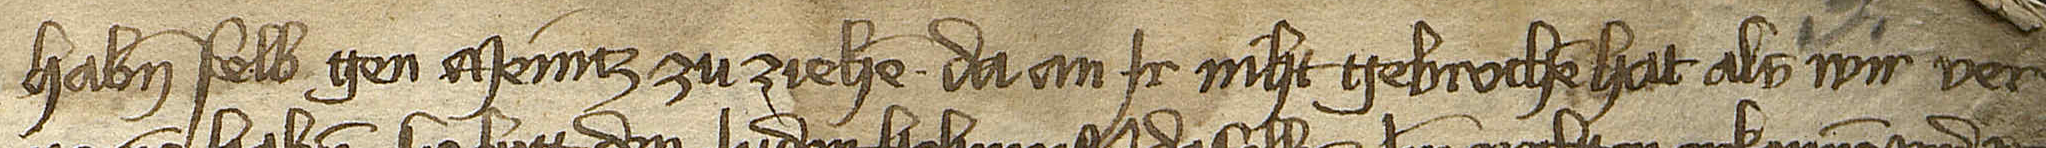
habn* ſelb gen Meincʒ ʒu ʒiehe* . da an Ir niht gebroche* hat als wir ver
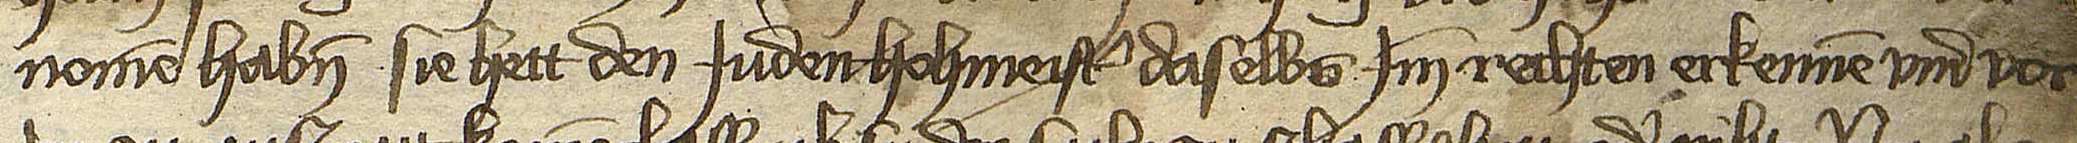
nome* habn* . ſie hett den Iuden hohmeiſt* daſelbs . Im* rechten erkenne* vnd vor
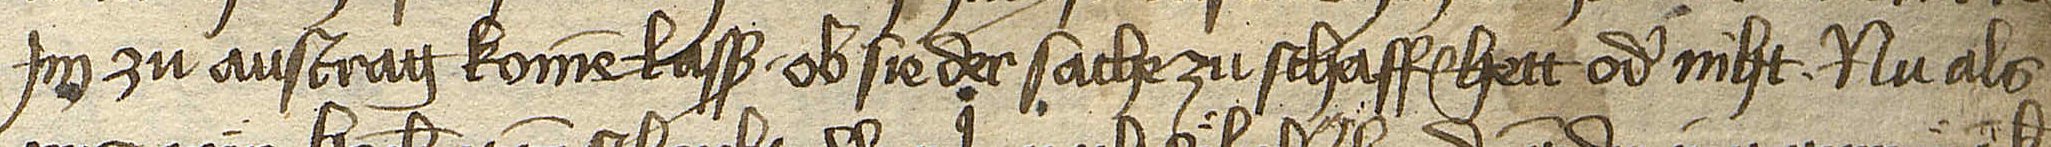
Im ʒu auſtrag kome* laſſ* / ob ſie der ſache ʒu ſchaff* hett od* niht . Nu als
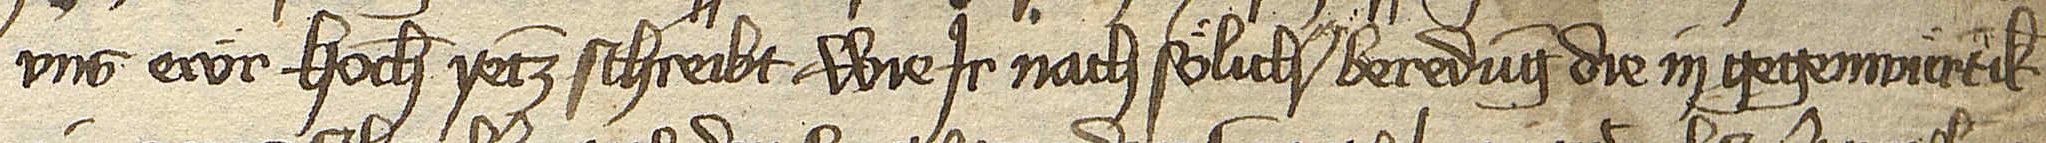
vns ewr Hoch* yecʒ* ſchreibt / wie Ir nach ſölich* beredug* die in gegenwürtik*
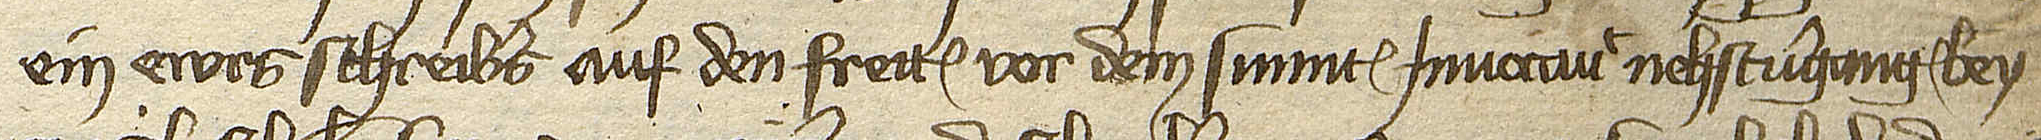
ein ewrs ſchreib*s auf den freit* vor dem ſunnt* Inuocau* nehſtu*gang* bey
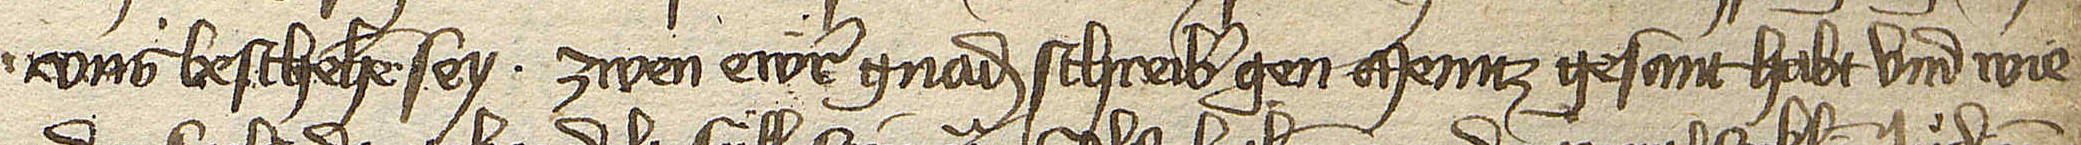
vns beſchehe* ſey . ʒwen ewr* gnad* ſchreib* gen Meincʒ geſant habt vnd wie
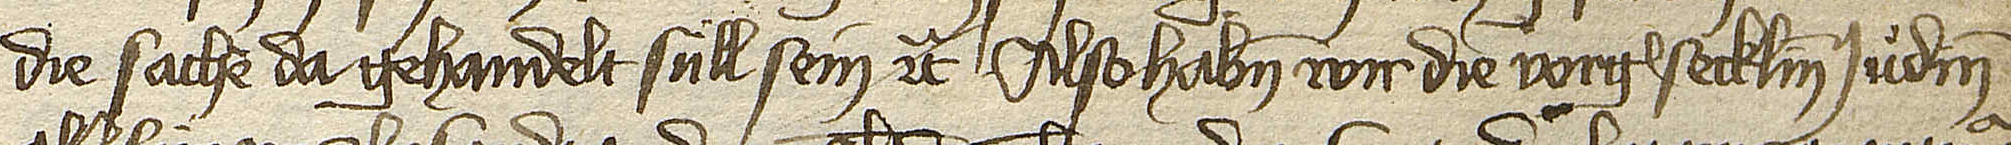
die ſache da gehandelt ſüll ſein ec* . Alſo habn* wir die vorg* ſecklin* Iüdin*
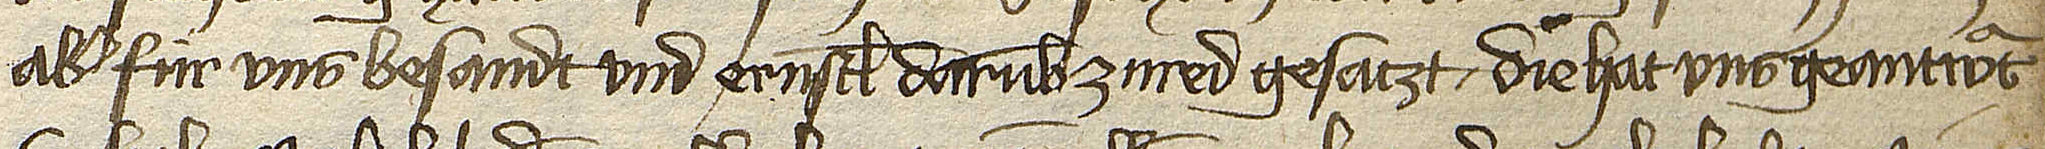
ab* für vns beſandt vnd ernſtl* darub* ʒured geſacʒt / die hat vns geantw*t
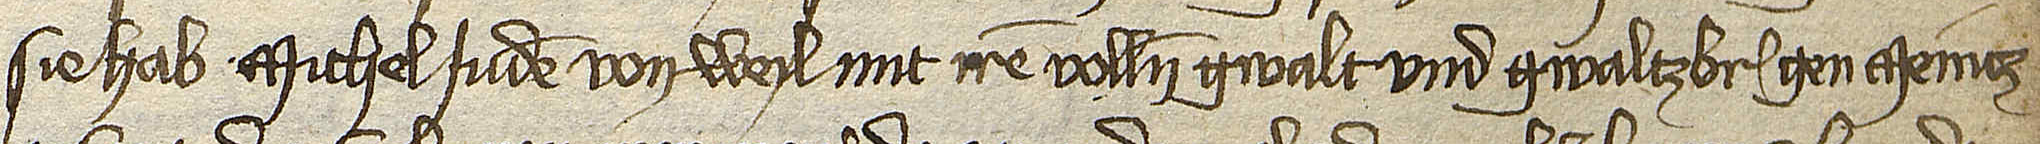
ſie hab . Michel Iude* von weyl mit ire* volln* gwalt* vnd gwalcʒbr* gen Meincʒ
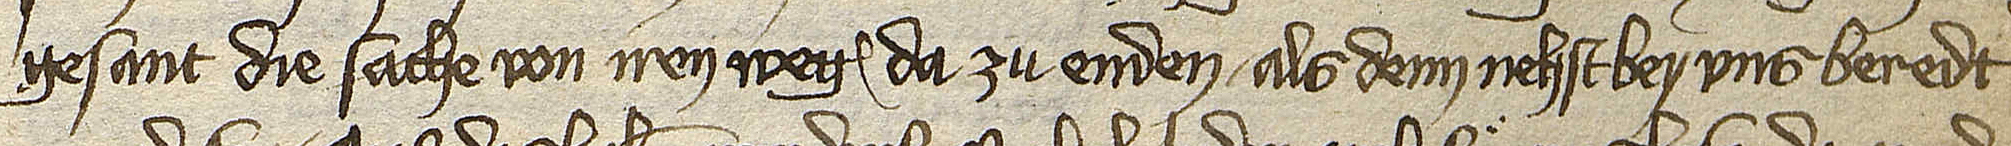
geſant die ſache von iren weg* da ʒu enden / als denn nehſt bey vns beredt
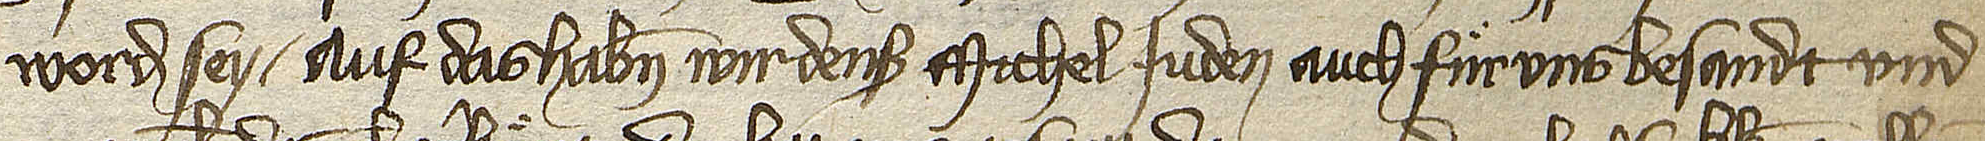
word* ſey / Auf das habn* wir denſ* Michel . Iuden auch für vns beſandt vnd
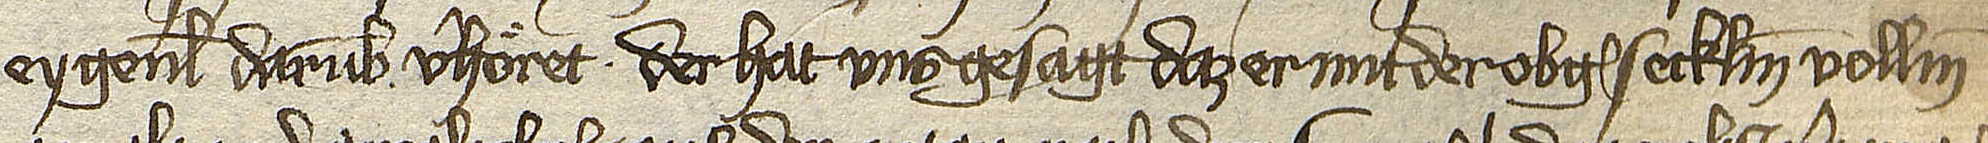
eygenl* darub* v*höret . Der hat vns geſagt daʒ er mit der obg* ſecklin* vollm*
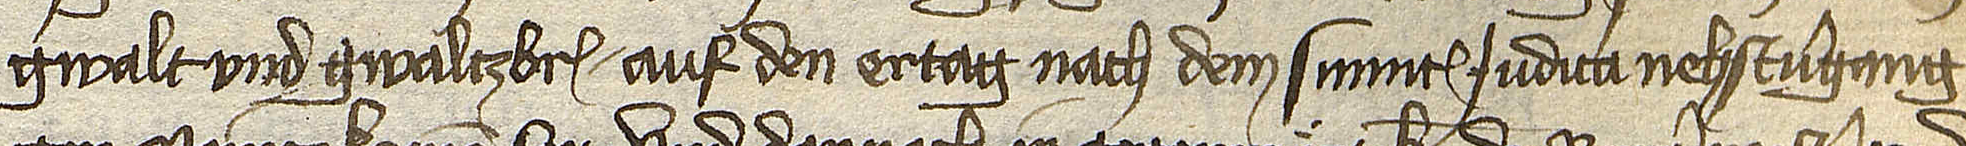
gwalt vnd gwalcʒbr* / auf den ertag nach dem ſunnt* Iudica nehſtu*gang*
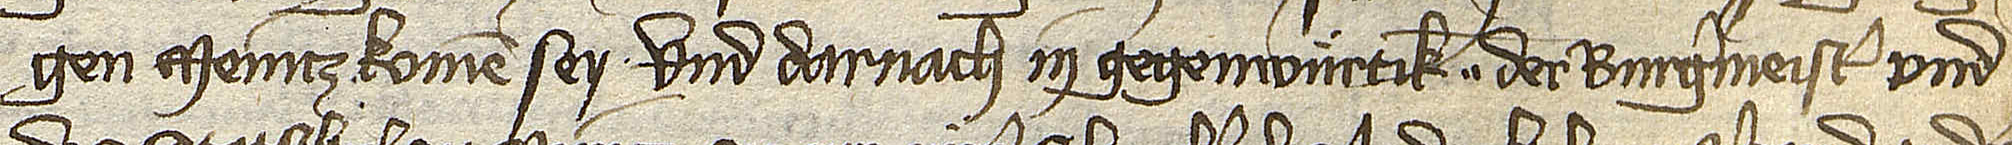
gen Meincʒ kome* ſey . Vnd darnach in gegenwürtik* ~ der Burg*meiſt* vnd
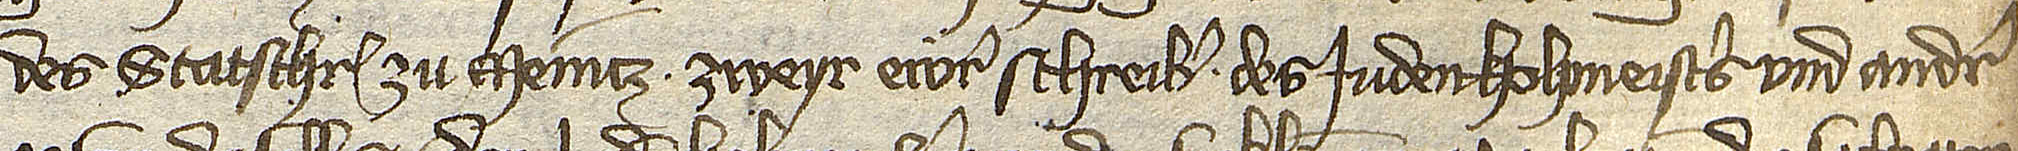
des Statſchr* ʒu Meincʒ . ʒweyr ewr* ſchreib* . des Iuden hohmeiſt*s vnd andr*
